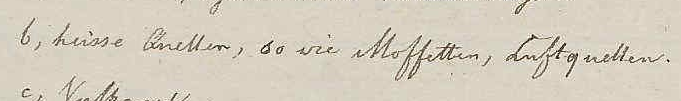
b, heisse Quellen, so wie Moffetten, Luftquellen.
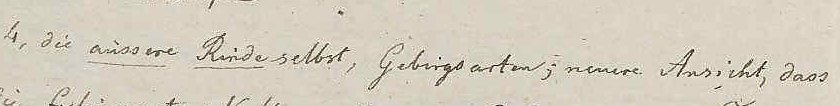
4, die äussere Rinde selbst, Gebirgsarten; neuere Ansicht, dass
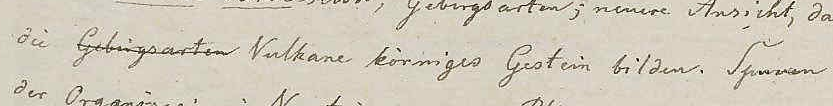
die GebirgsartenVulkane körniges Gestein bilden. Spuren
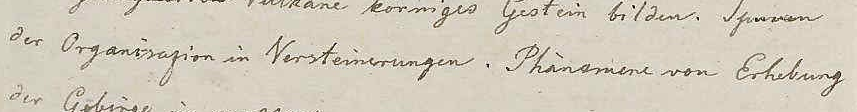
der Organisazion in Versteinerungen. Phänomene von Erhebung
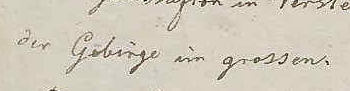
der Gebirge im grossen.
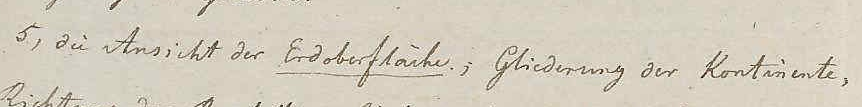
5, die Ansicht der Erdoberfläche; Gliederung der Kontinente,
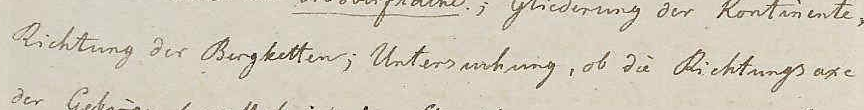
Richtung der Bergketten; Untersuchung, ob die Richtungsaxe
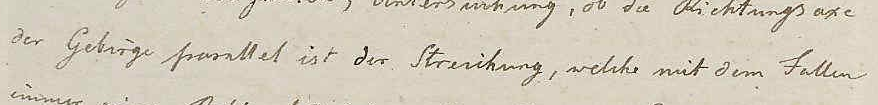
der Gebirge parallel ist der Streichung, welche mit dem Fallen
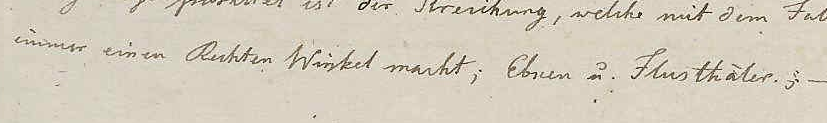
immer einen Rechten Winkel macht; Ebnen u. Flusthäler. –
